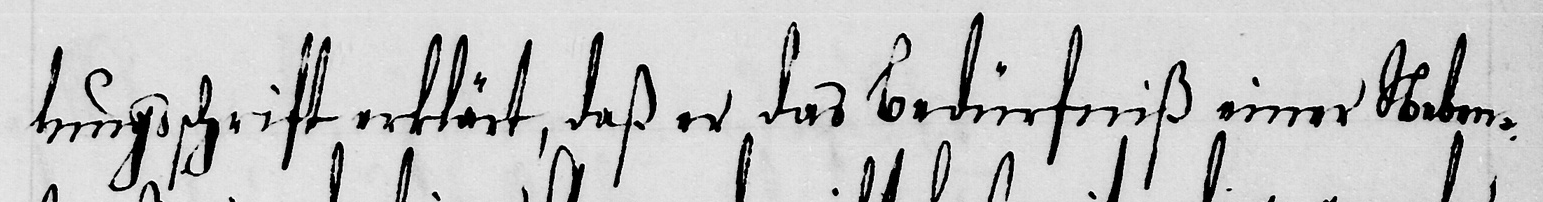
lungsschrift erklärt, daß er das Bedürfniß einer Neben¬
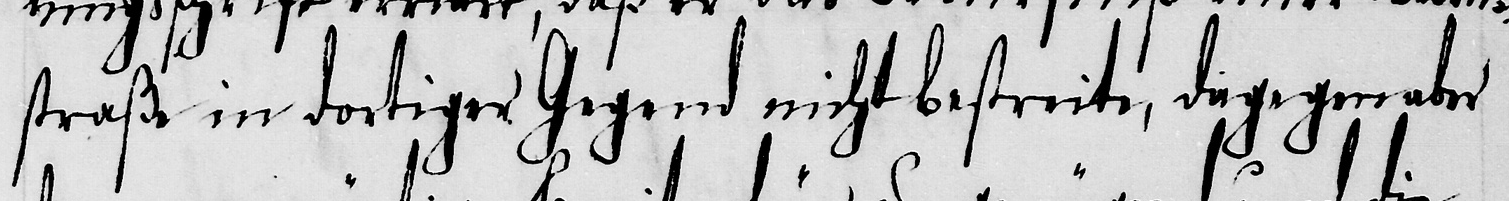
straße in dortiger Gegend nicht bestreite, dagegen aber
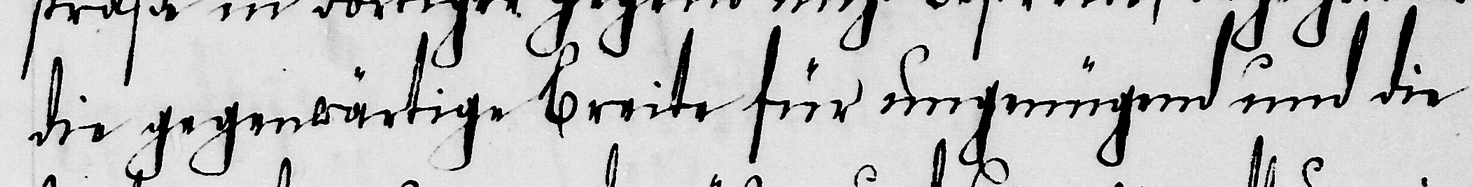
die gegenwärtige Breite für ungenügend und die
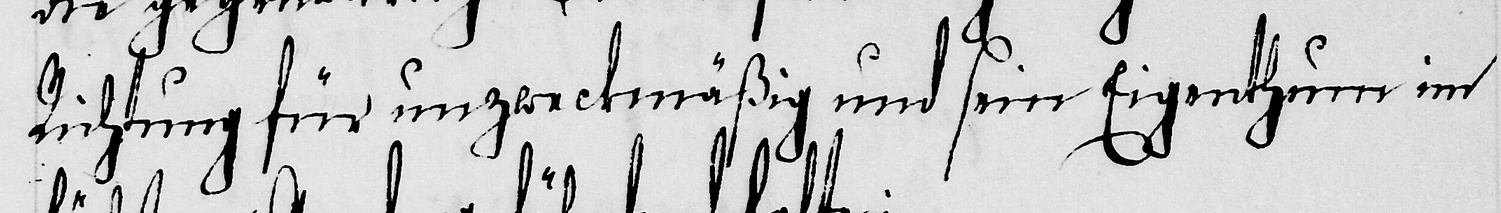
Richtung für unzweckmäßig und sein Eigenthum im
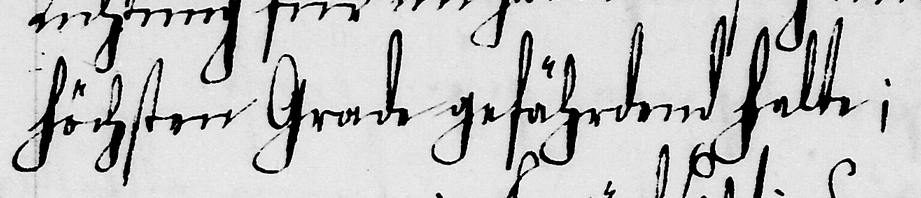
öchsten Grade gefährdend halte;
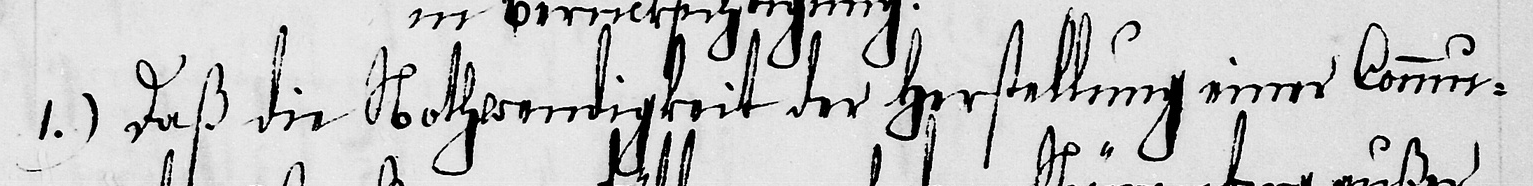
1.) Daß die Nothwendigkeit der Herstellung einer Commu¬
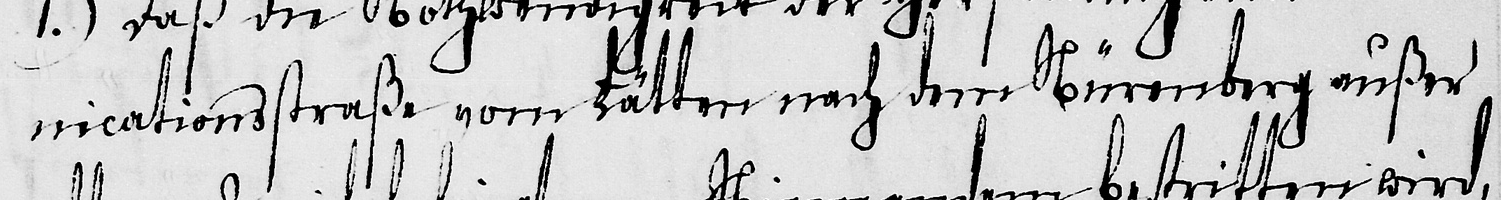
nicationsstraße vom Lätten nach dem Nürenberg außer
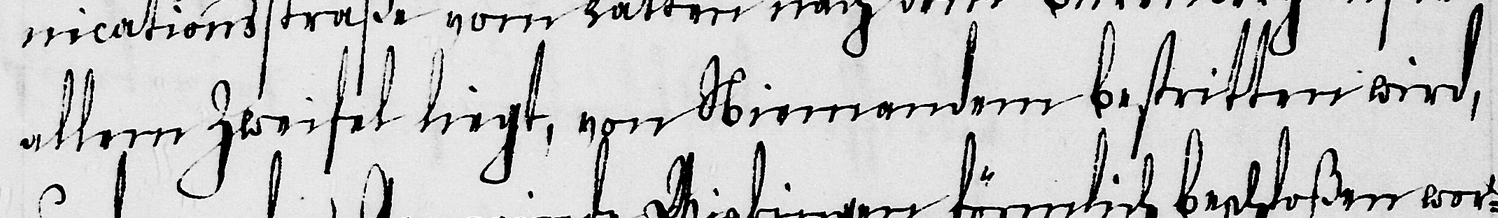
allem Zweifel liegt, von Niemandem bestritten wird,
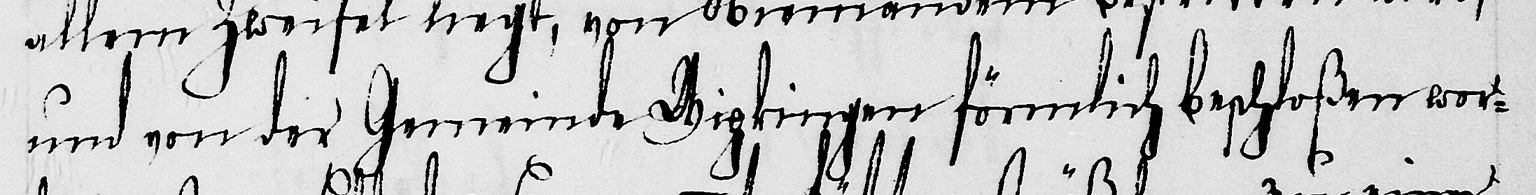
und von der Gemeinde Wipkingen förmlich beschloßen wor¬
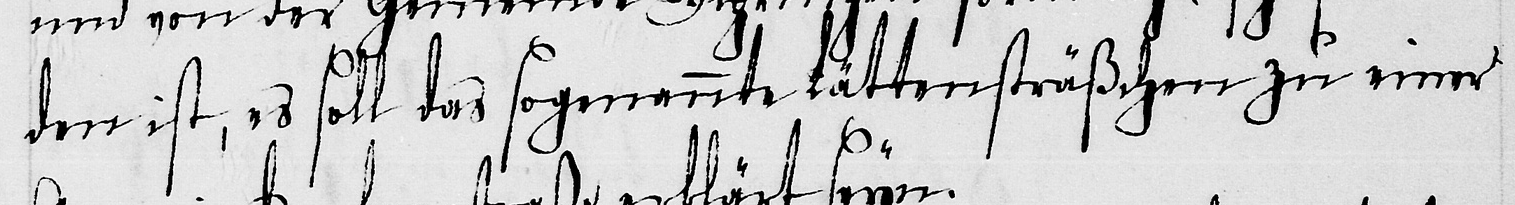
den ist, es soll das sogenannte Lättensträßchen zu einer
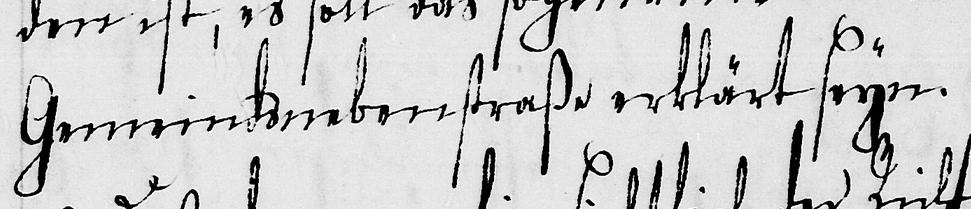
Gemeindsnebenstraße erklärt seyn.
